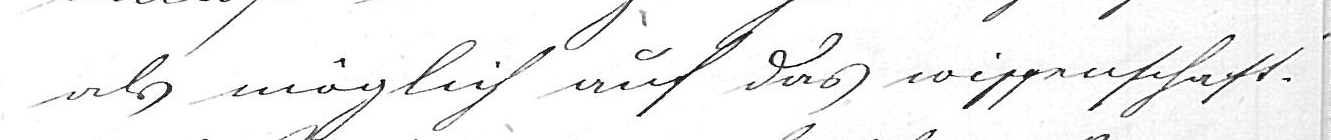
als möglich auf das wissenschaft-
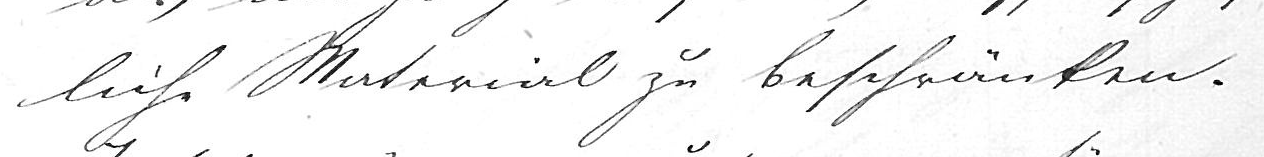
liche Material zu beschränken.
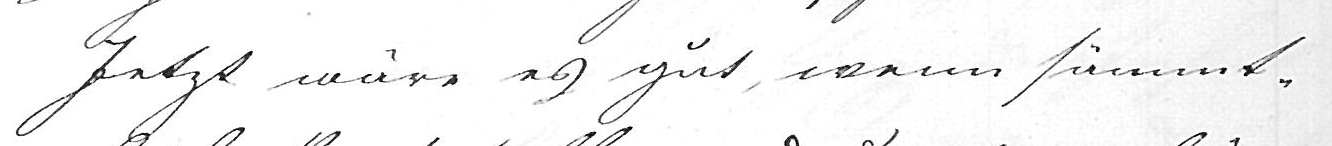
Jetzt wäre es gut, wenn sämmt-
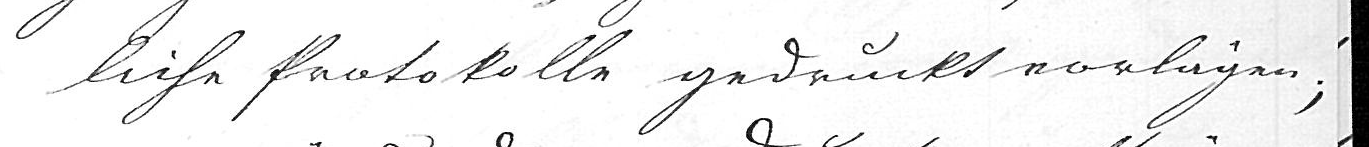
liche Protokolle gedruckt vorlägen;
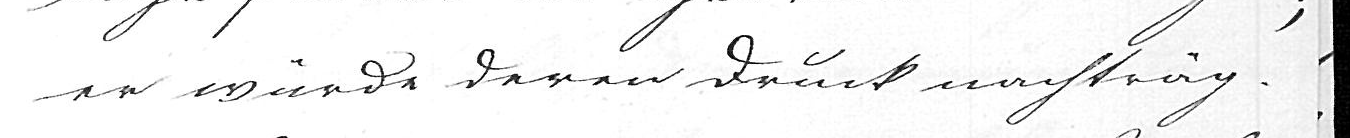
er würde deren Druck nachträg-
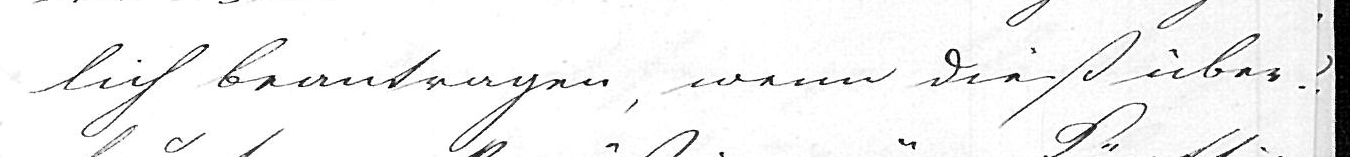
lich beantragen, wenn dieß über-
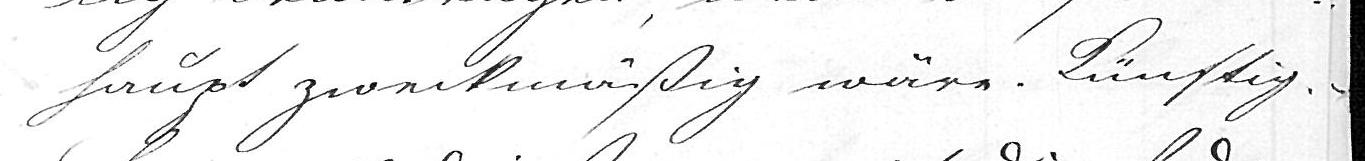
haupt zweckmäßig wäre. Künftig-
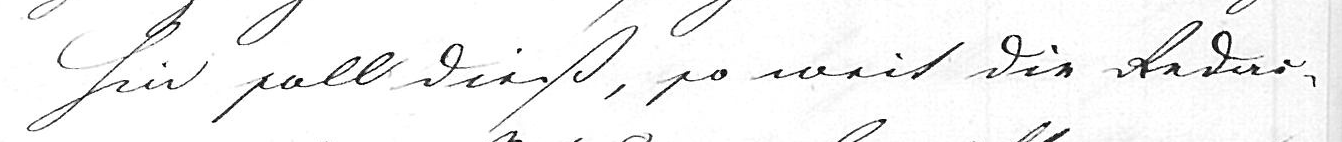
hin soll dieß, so weit die Redac-
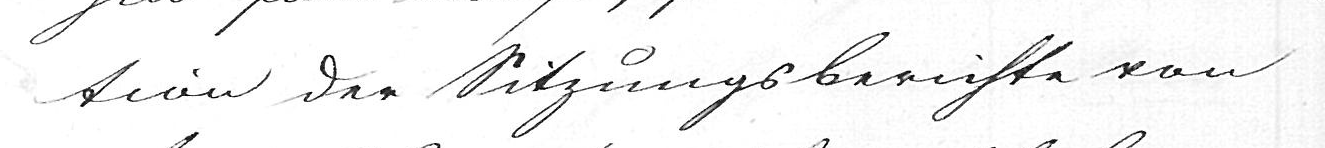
tion der Sitzungsberichte von
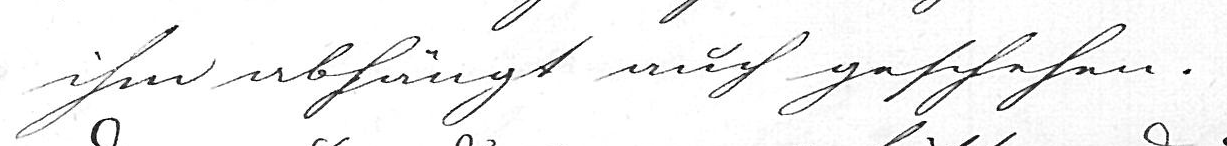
ihm abhängt auch geschehen.
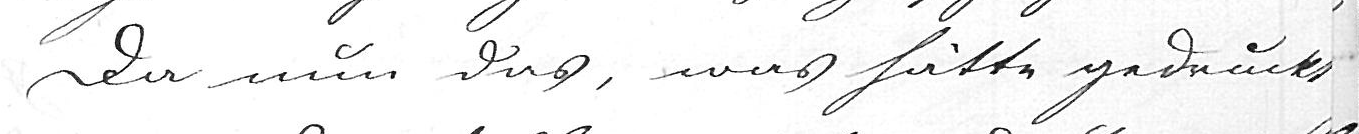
Da nun das, was hätte gedruckt
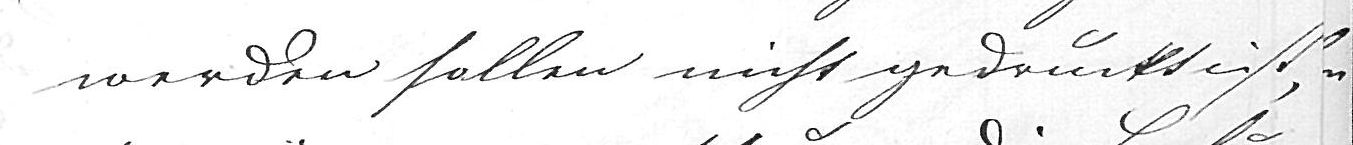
werden sollen nicht gedruckt ist,
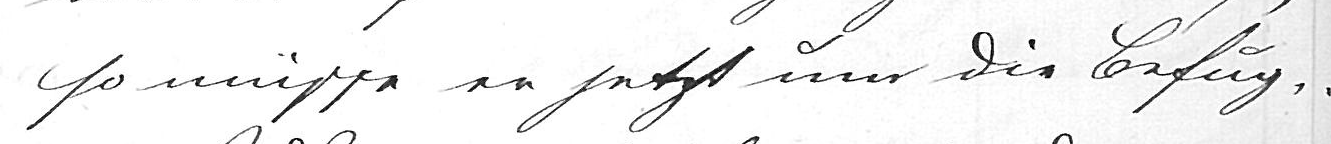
so müsse er jetzt um die Befug-
